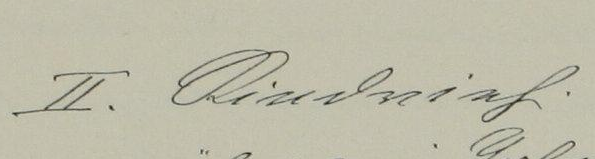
II. Rindvieh
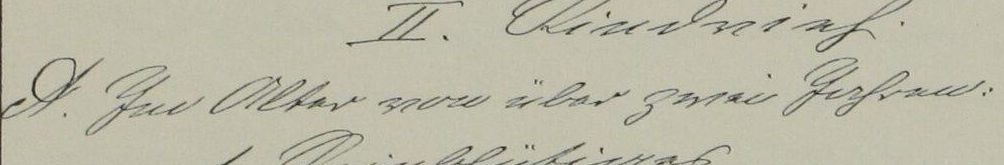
A. Im Alter von über zwei Jahren:
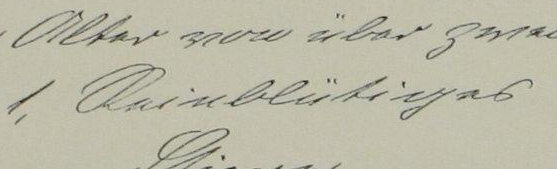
1. Reinblütiges
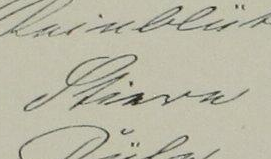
Stiere
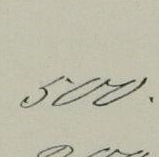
500
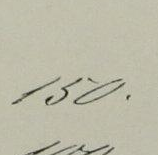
150
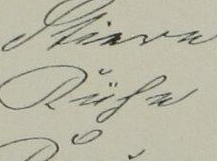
Kühe
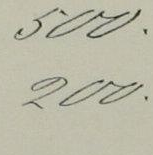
200
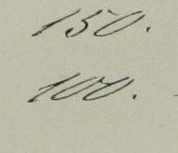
100
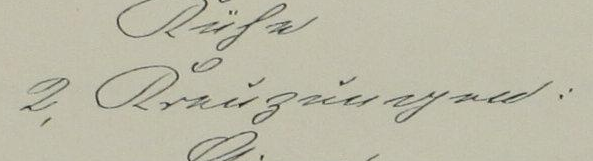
2. Kreuzungen:
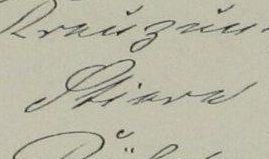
Stiere
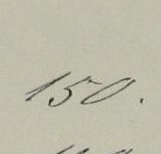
150
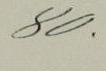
80
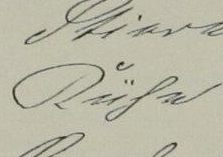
Kühe
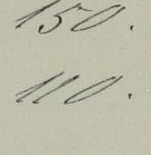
110
